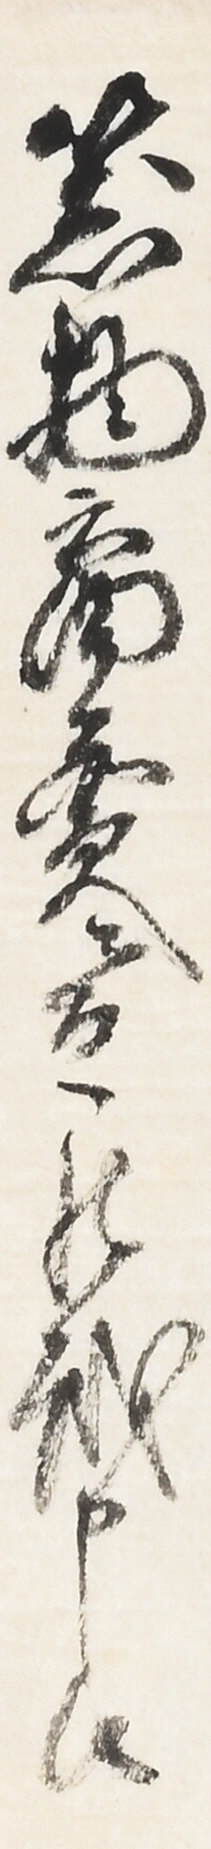器物商売ニ而罷越申候
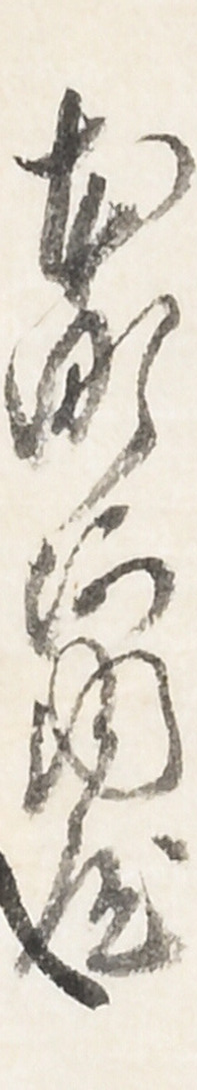本町河内屋
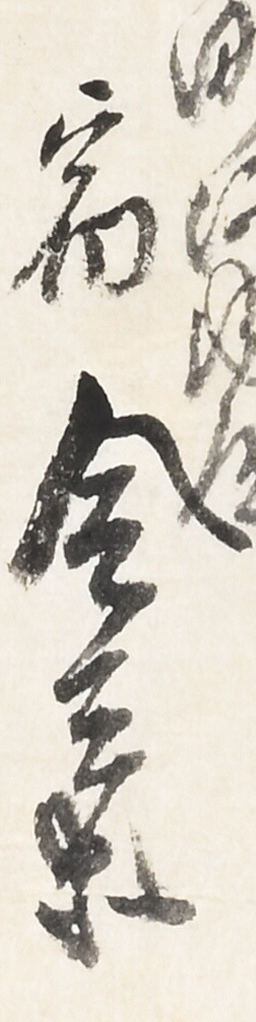宿金兵衛
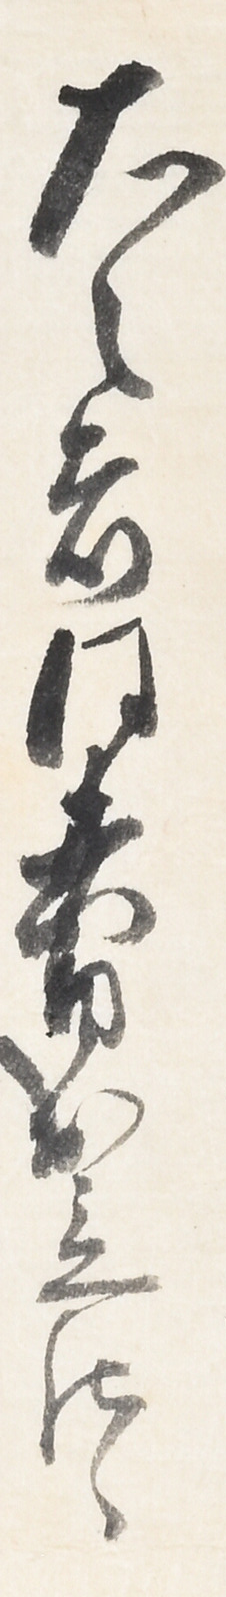右之者同六日出立仕候
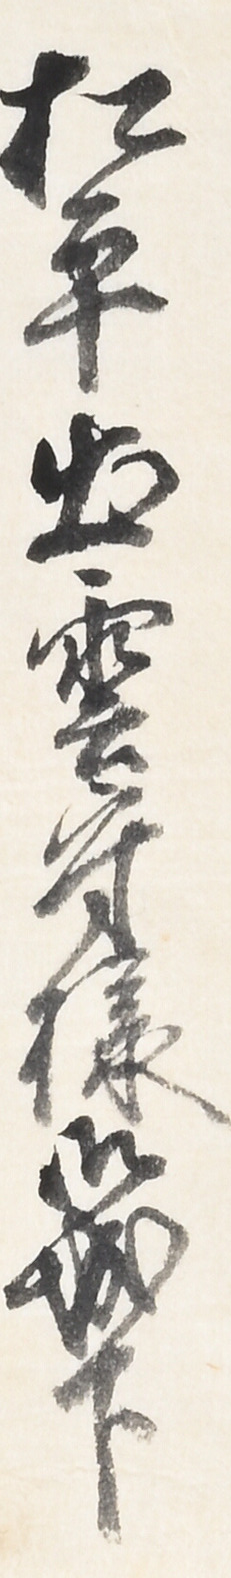松平出雲守様御城下
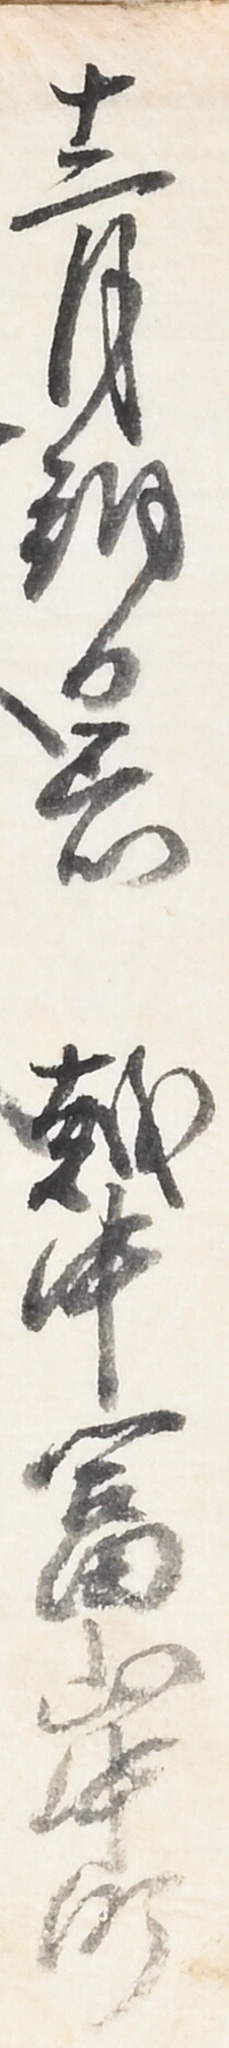十二月朔日着越中冨山中町
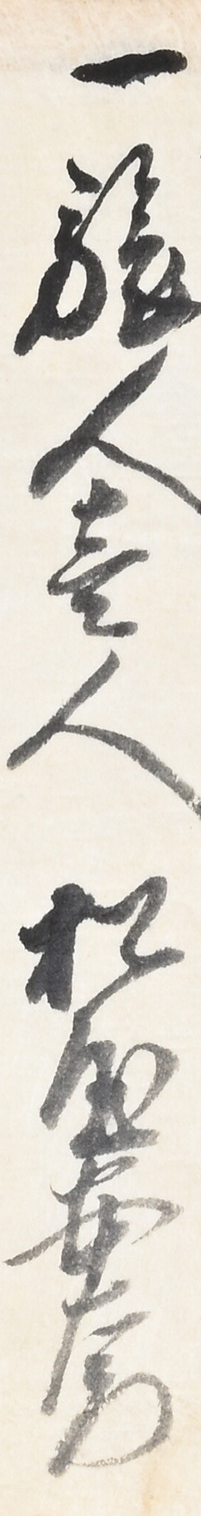一旅人壱人松屋安右衛門
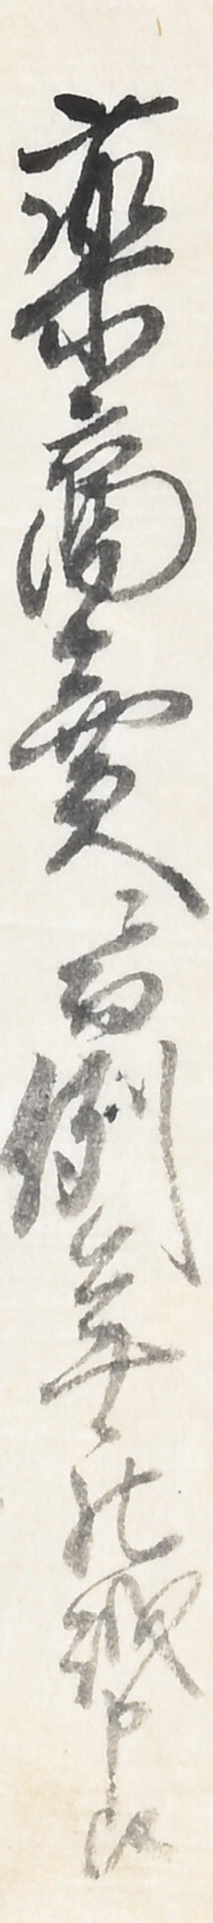薬商売ニ而例年罷越申候
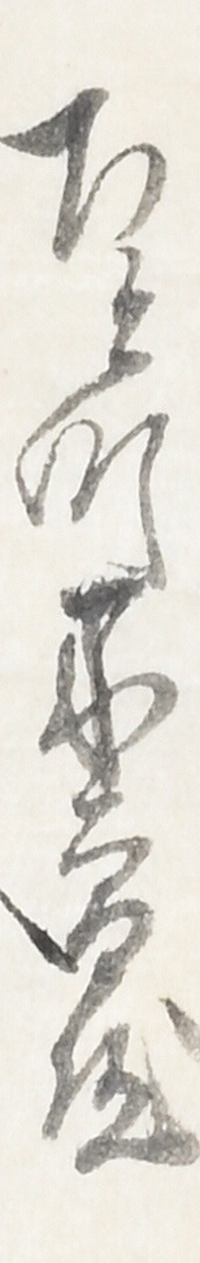下モ町木曽屋
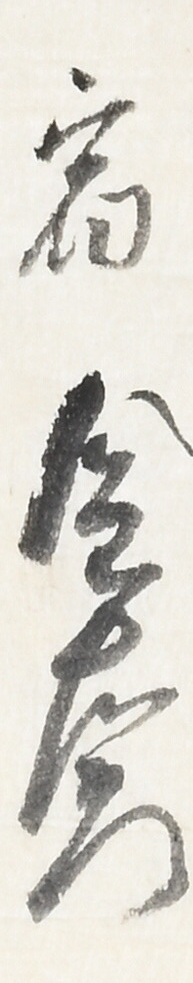宿金右衛門
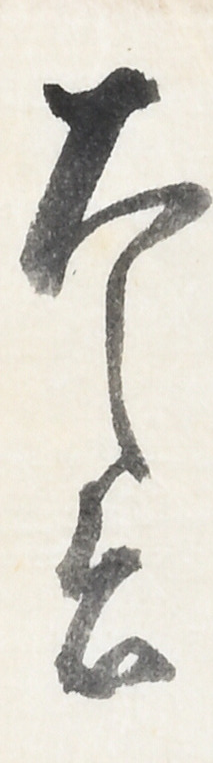右之者
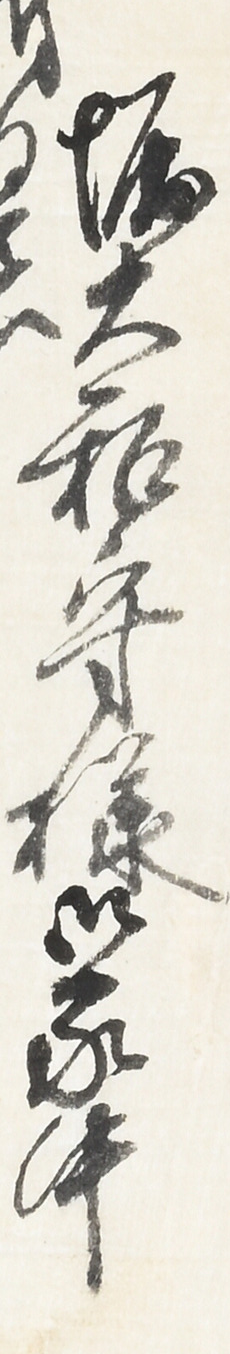堀大和守様御家中
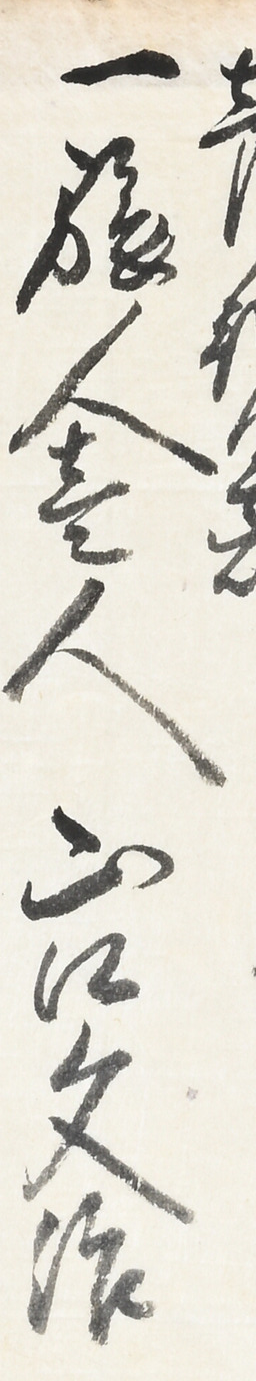一旅人壱人山口文治
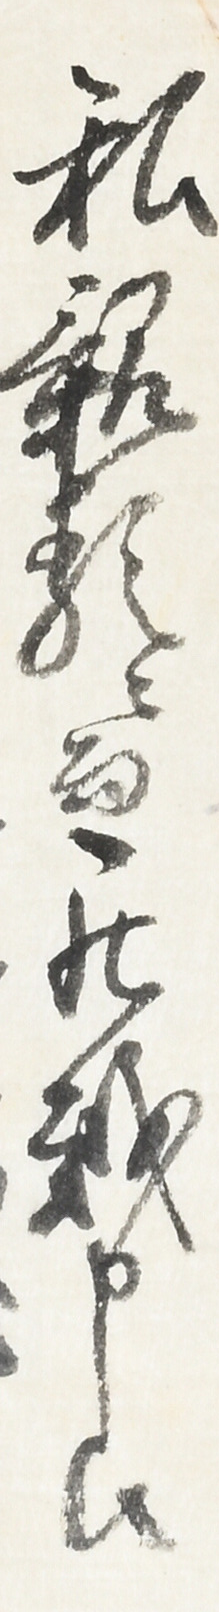私親類ニ而罷越申候
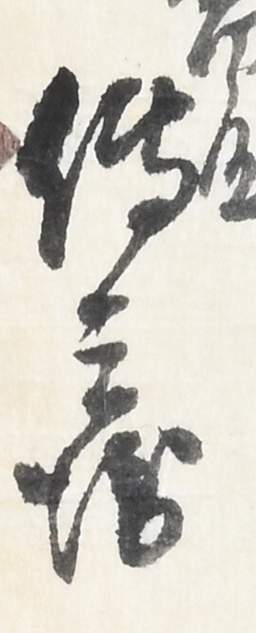伝兵衛
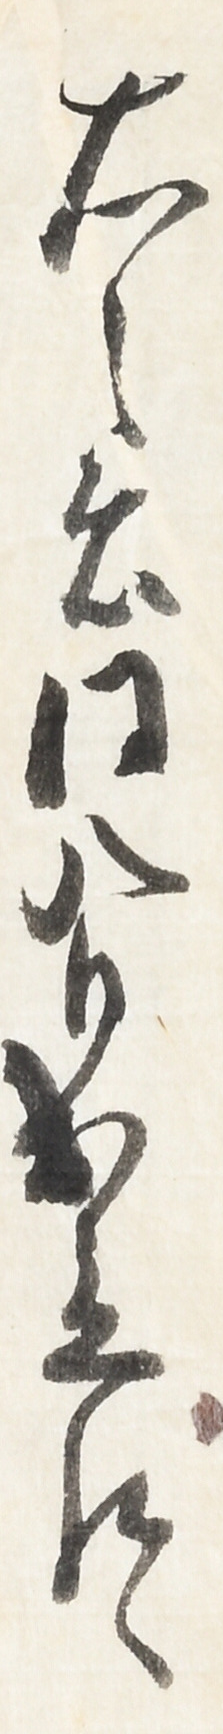右之者同八日出立仕候
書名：旅人泊控帳
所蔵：伊那市立高遠町図書館・合同会社AMANE
